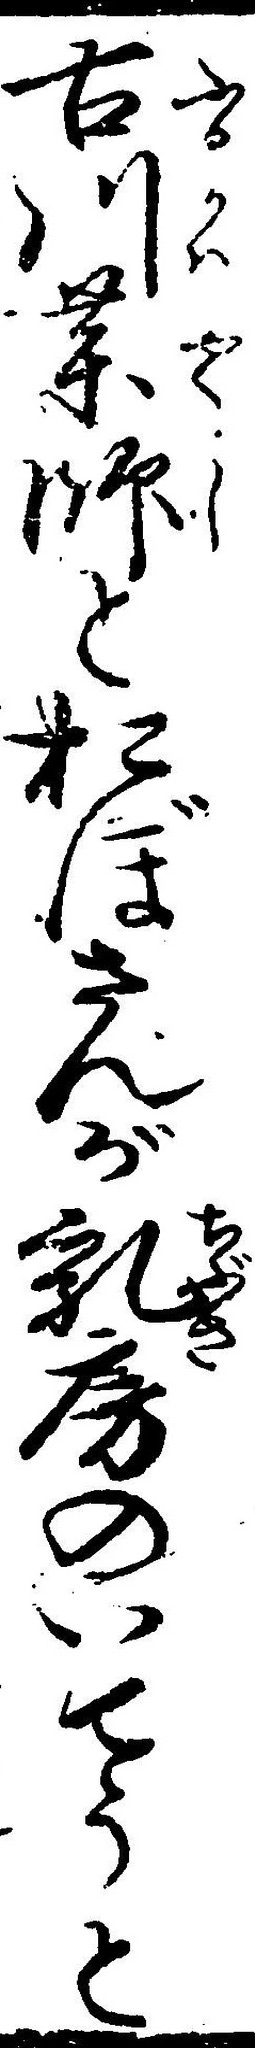古川薬師とおぼさんが乳房のいてうと
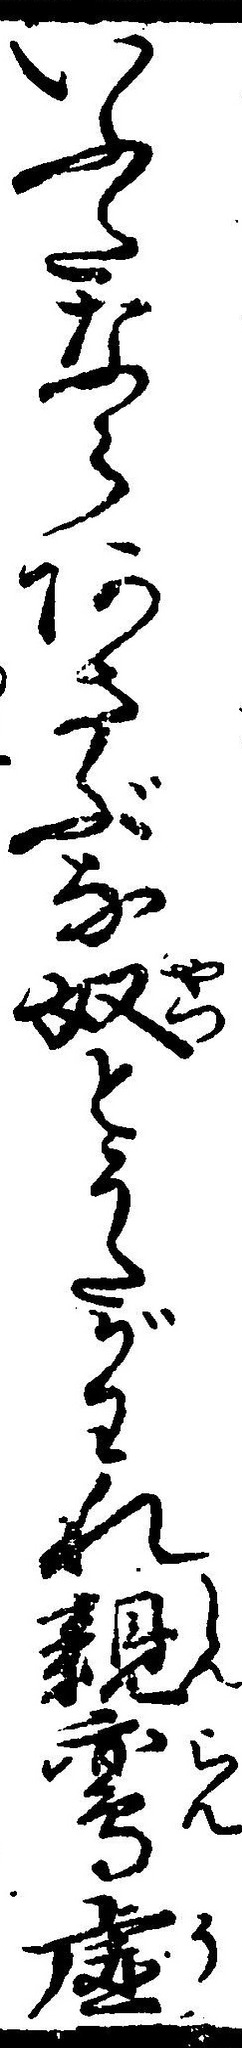いふたならあさぶな奴とうたがわれ親鸞虚
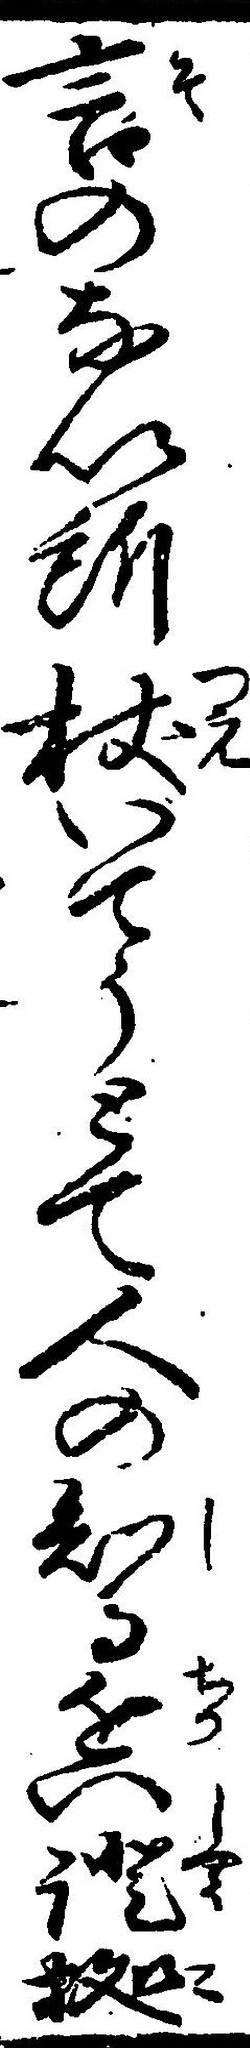言のない所杖いてうとて人の知る近い証拠
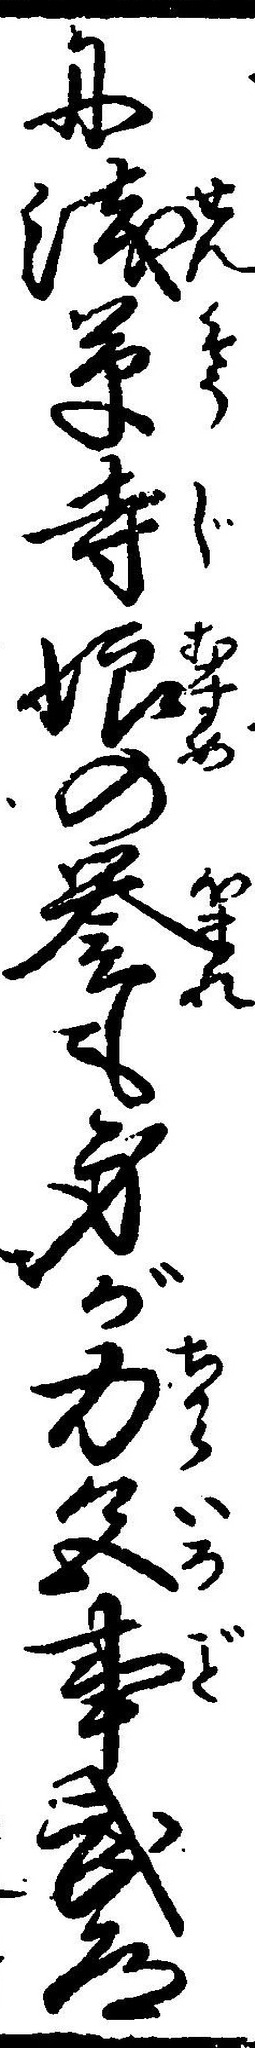に浅草寺娘の誉も身が力色事武道
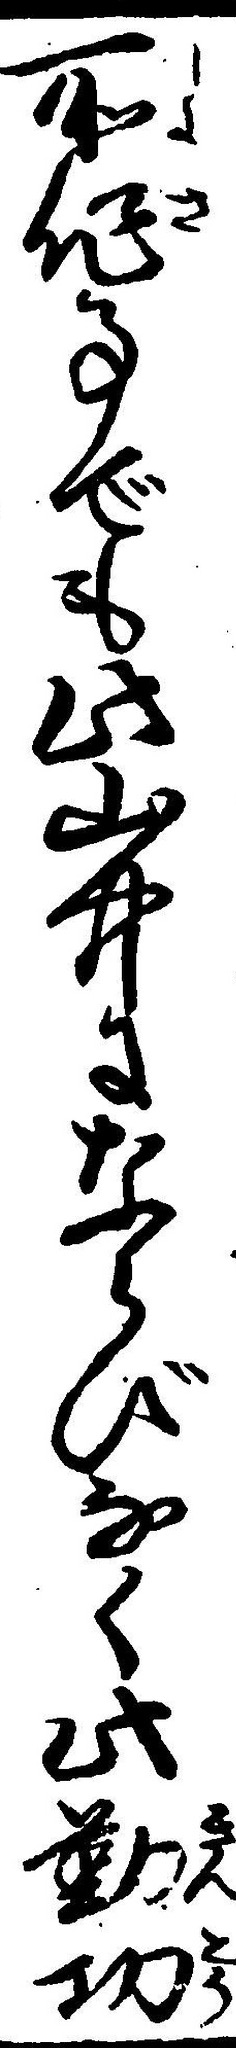所作事でも此山中にならびなく此勤功
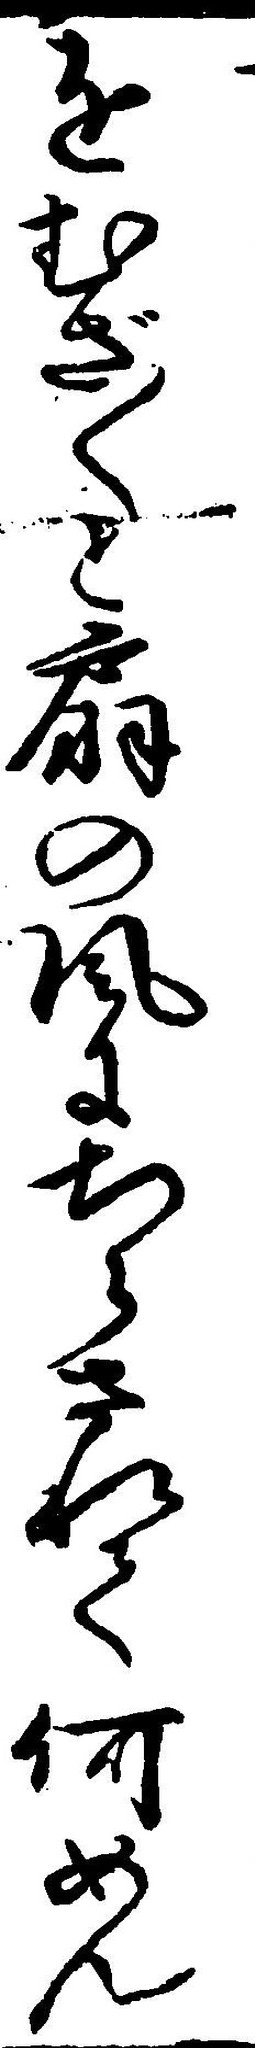をむざ〳〵と扇の風にちらされて何めん
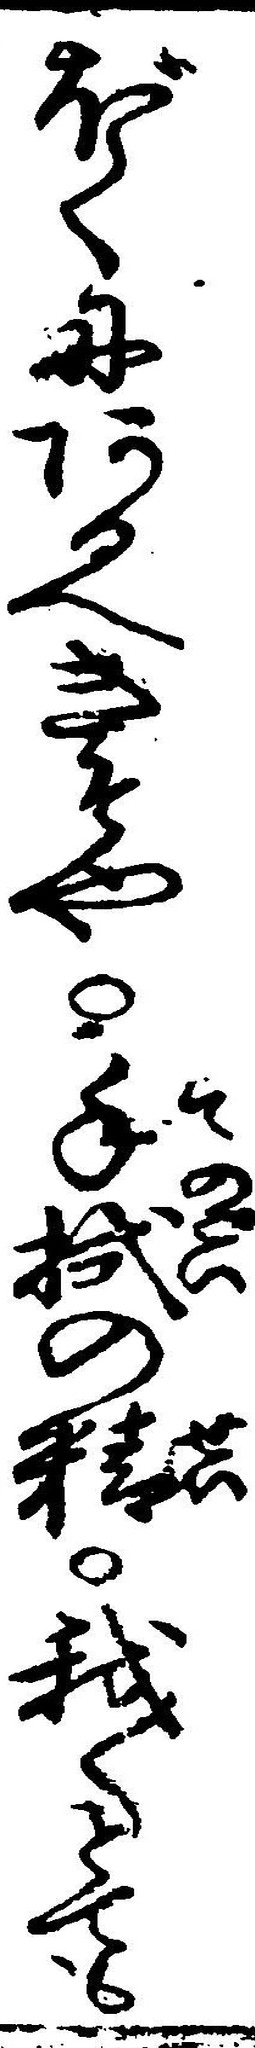ぼくになるへきそや○手拭の精○我〳〵とても
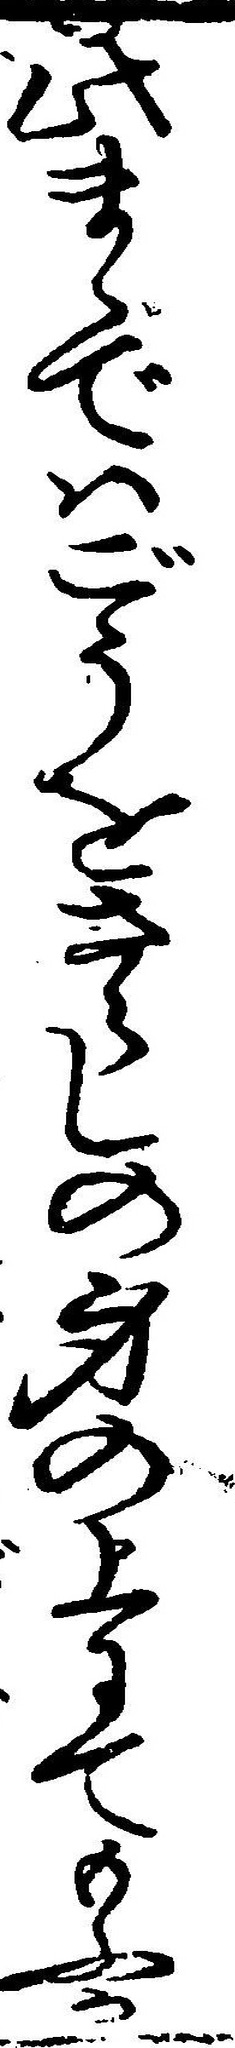此までいごうをさらしの身の上にてもふか
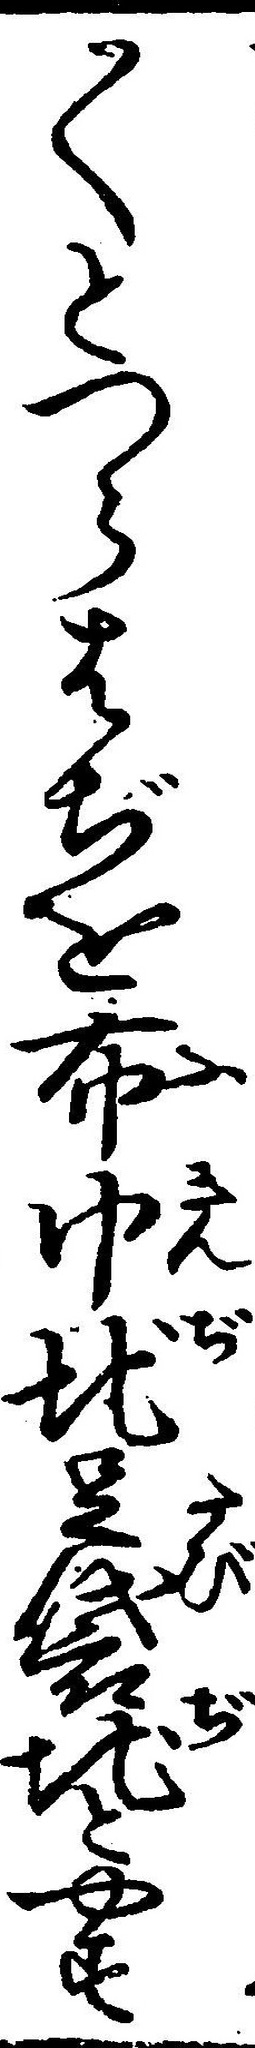〳〵とつらはぢを布巾地足袋地とやす
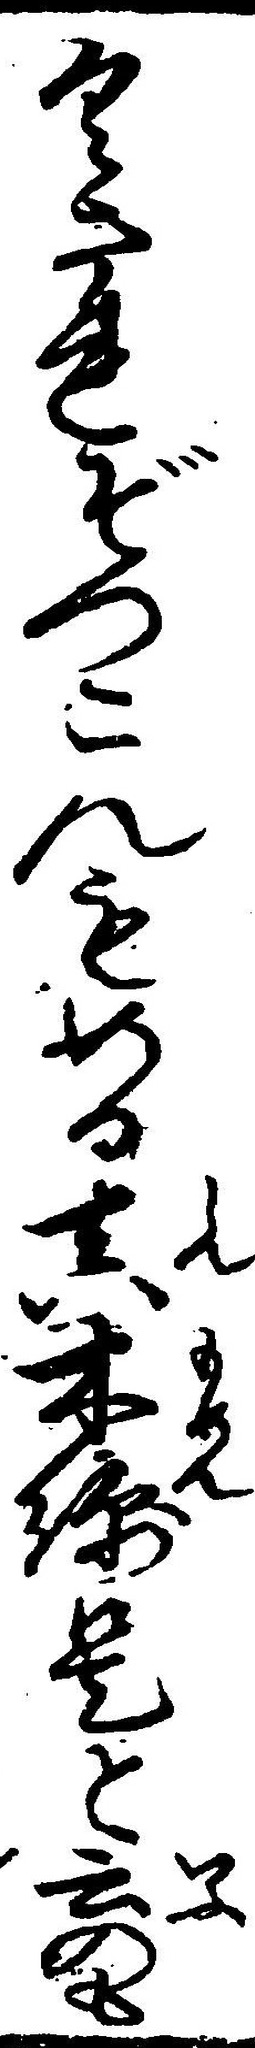くされぞつこんもめる真木綿是と云のも
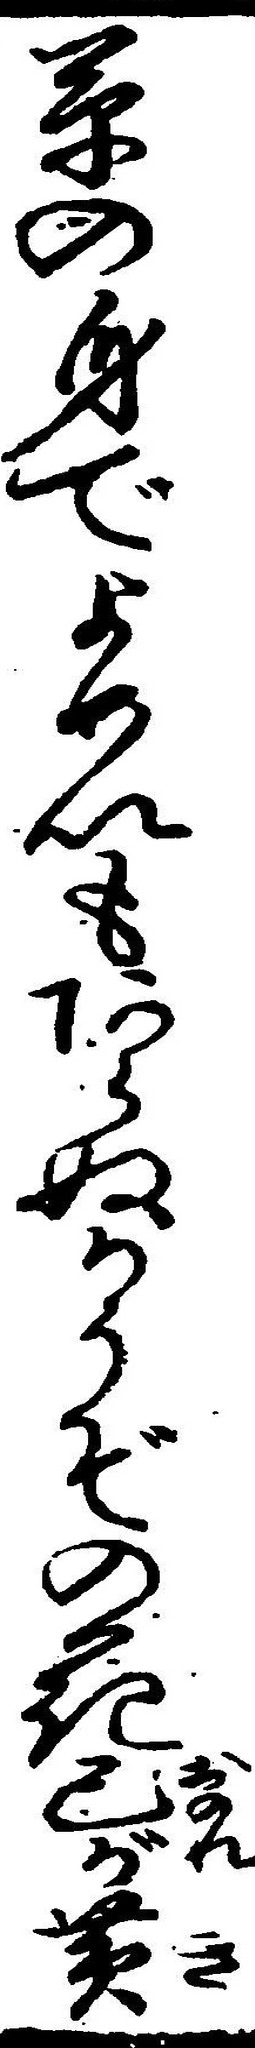草の身でよめいもあらぬかうぞの花己が黄
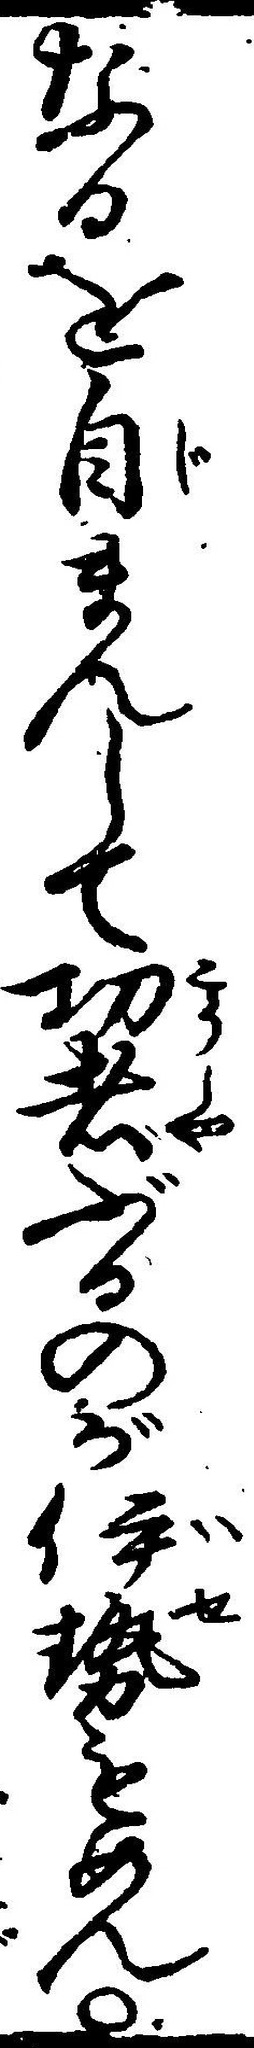なるを自慢して功者ぶるのが伊勢もめん○
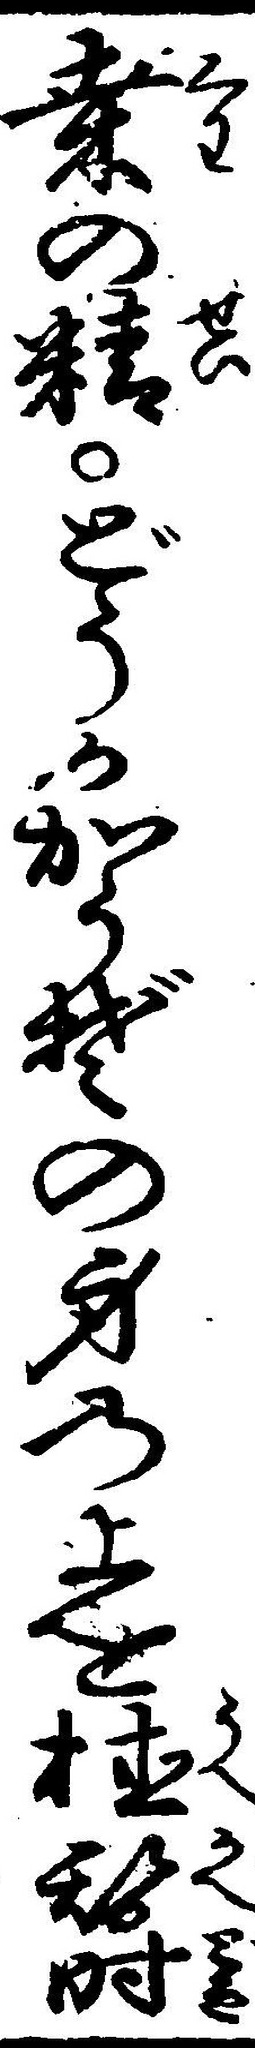桑の精○どうかかうぞの身の上を植替時

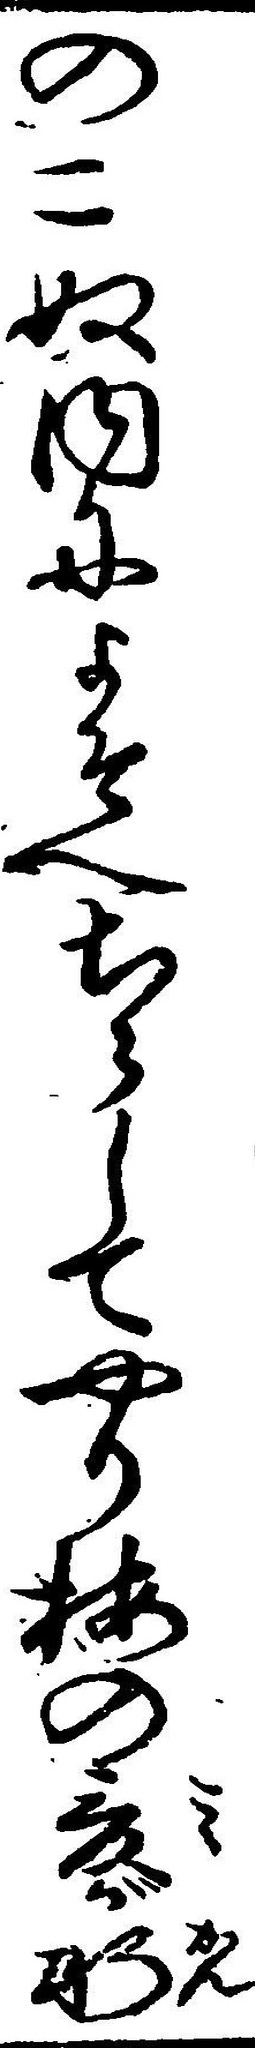のこぬ内によそへちらしてやり梅の爰が肝
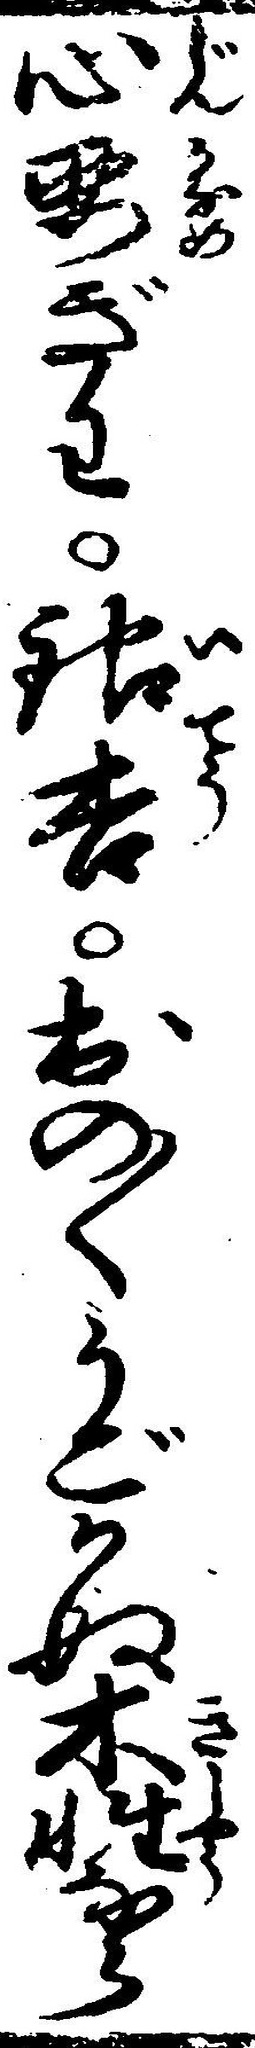心要ぎわ○銀杏○おの〳〵うごかぬ木性なら
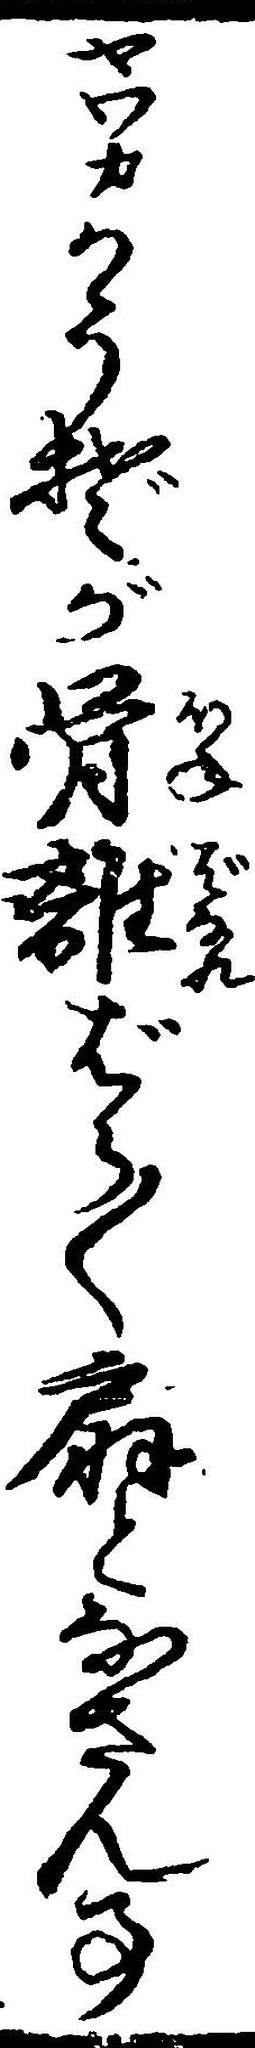ヤワカかうぞが骨離ばら〳〵扇となさん事
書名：草木芝居化物退治 / 泉花堂三蝶(十六兵衛)作
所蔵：東京大学総合図書館 General Library in the University of Tokyo, JAPAN
